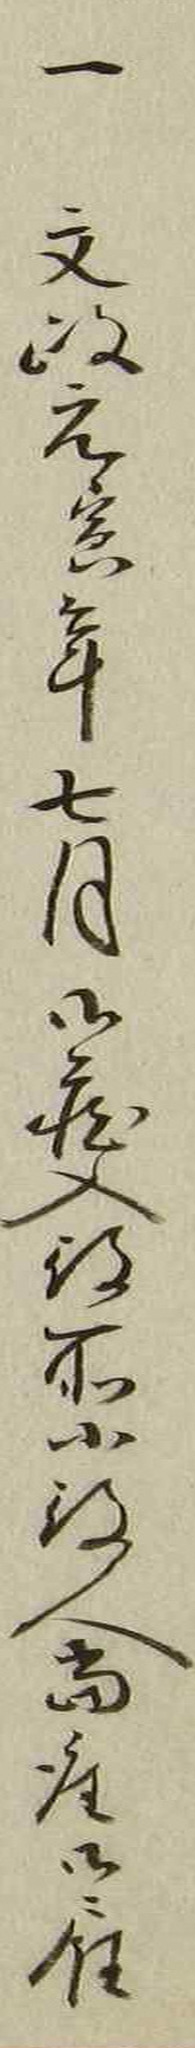一文政元寅年七月御蔵入役所小役人当座御雇
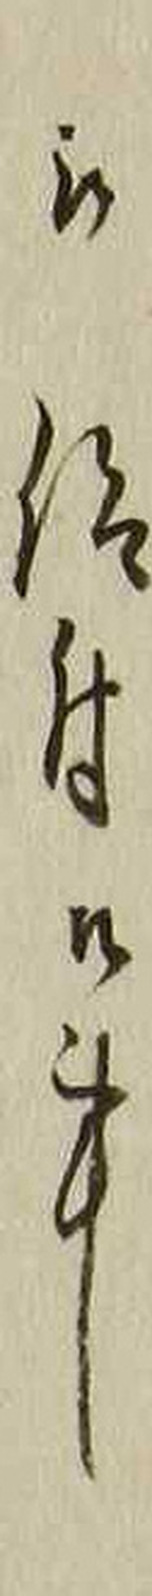被仰付候事
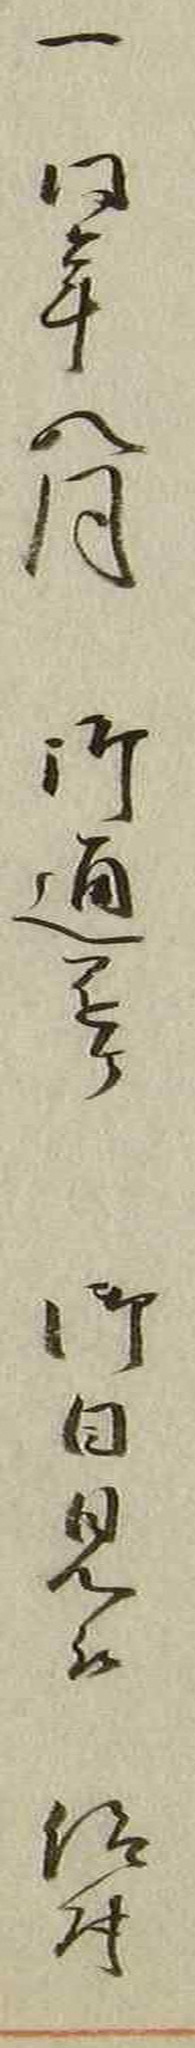一同年八月御通懸ケ御目見被仰付
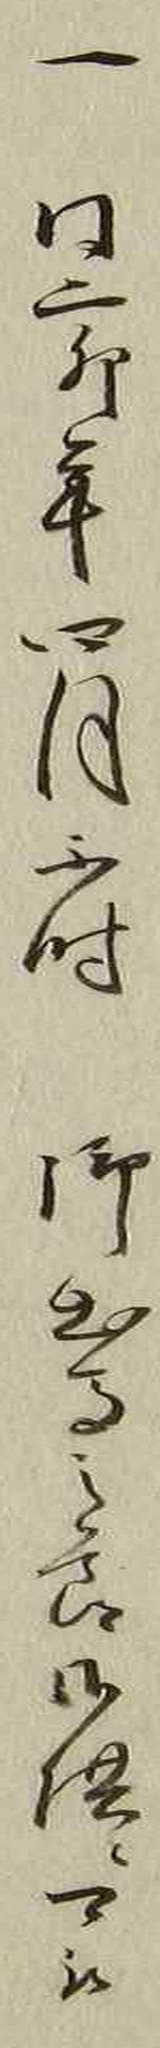一同二卯年四月不時御出馬之節御供ニ可被
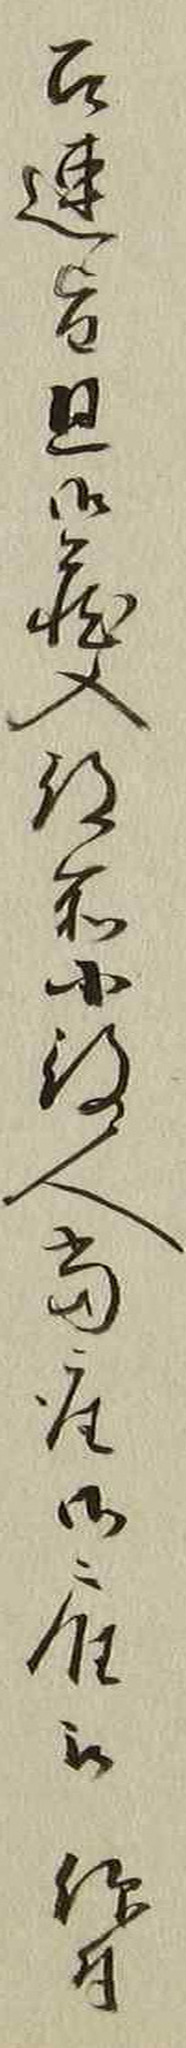召連旨且御蔵入役所小役人当座御雇被仰付
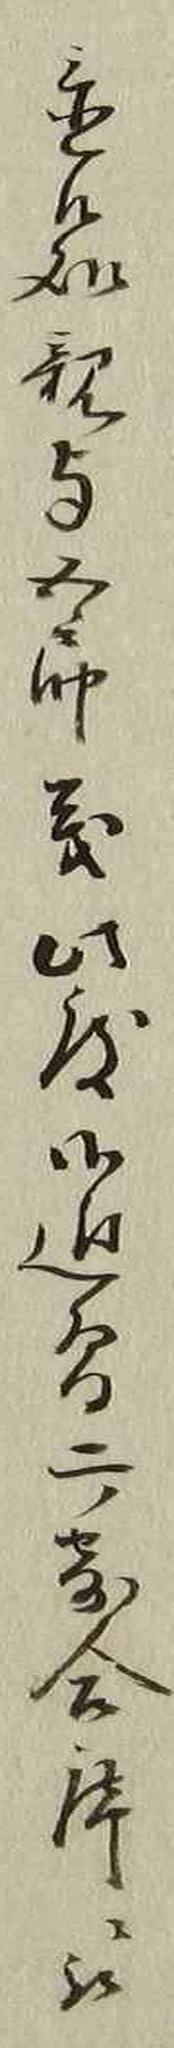置候処親与五郎義此度御近習二ノ寄合席ニ被
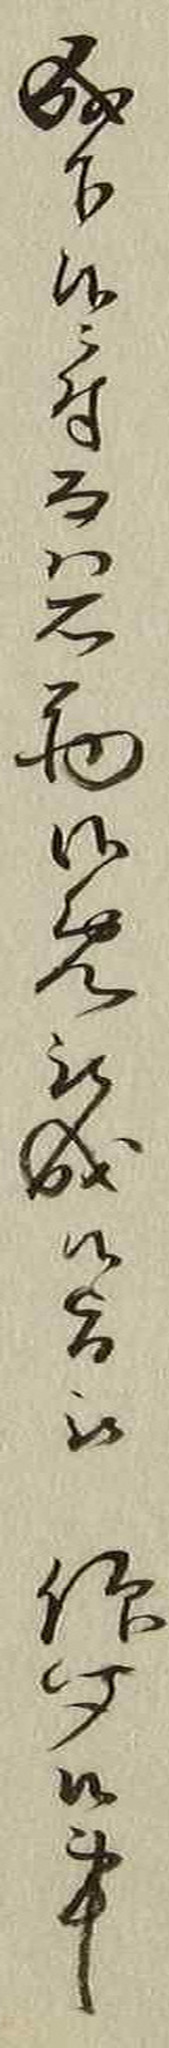成下候ニ付而ハ右勤御免被成候旨被仰聞候事
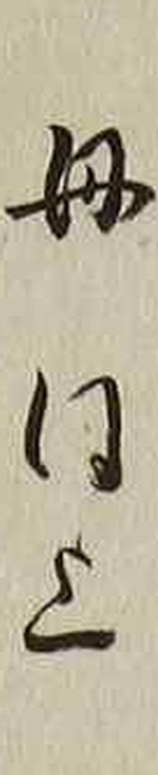母同上
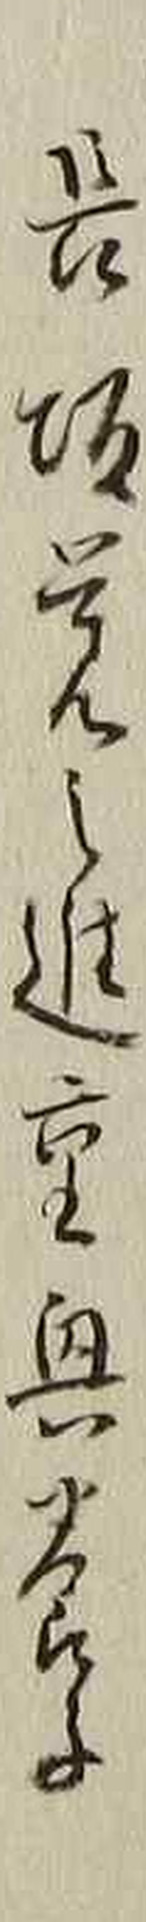長坂覚之進重興養子
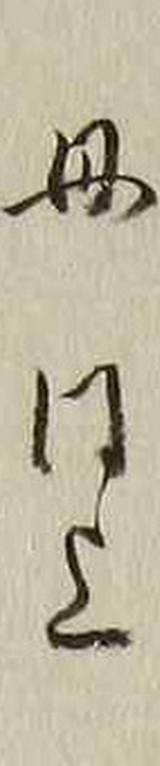母同上
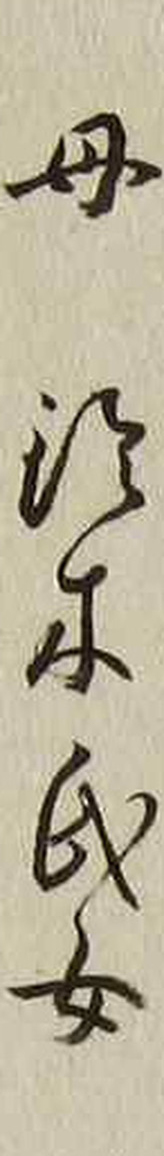母鈴木氏女
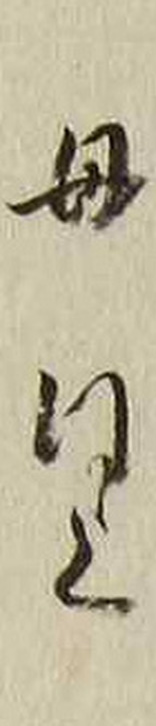母同上

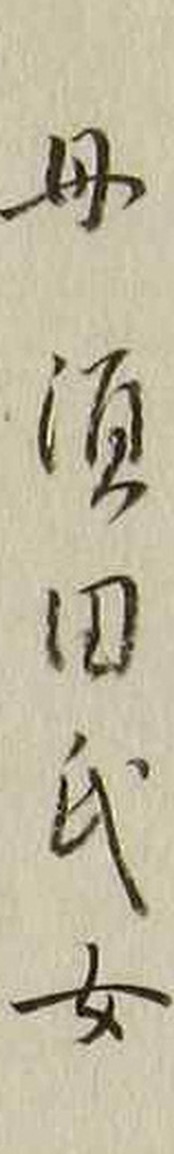母須田氏女
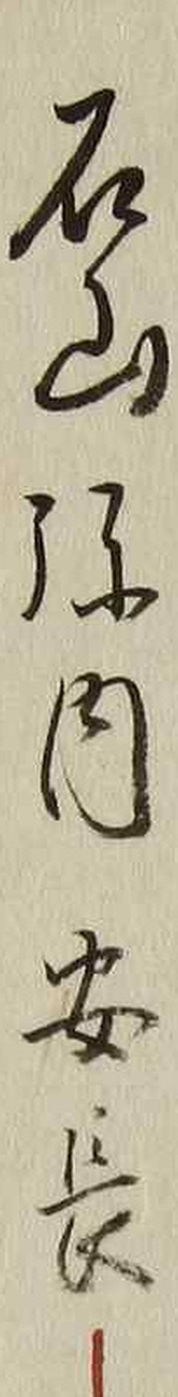石山弥内安長
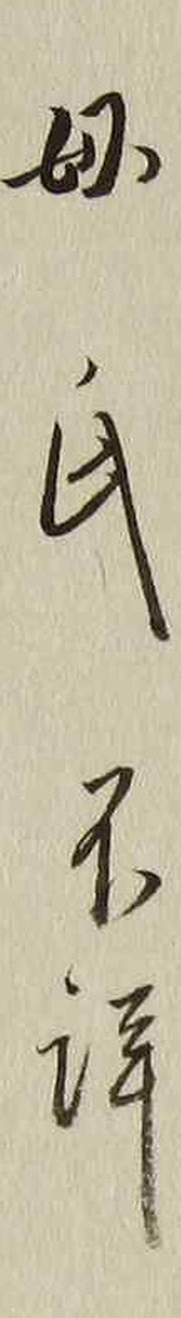母氏不詳
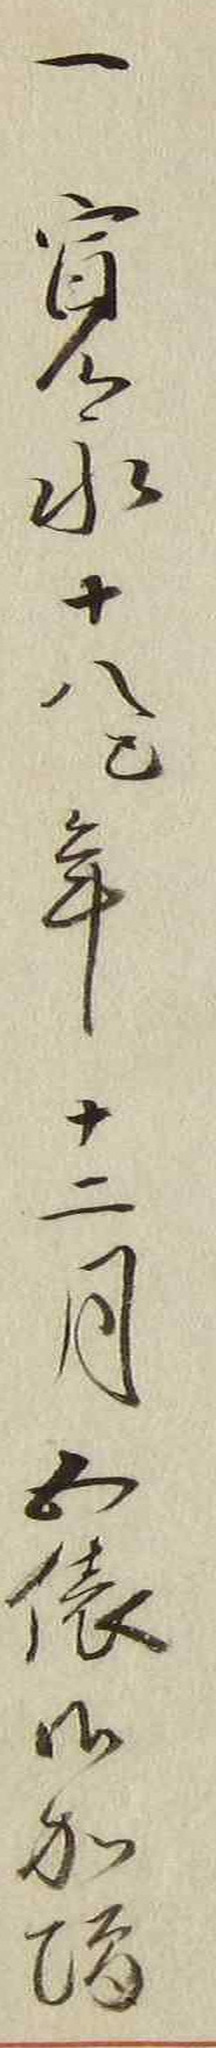一寛永十八巳年十二月五俵御加増
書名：諸士系譜　巻之32　い之部32
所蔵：会津若松市立会津図書館
